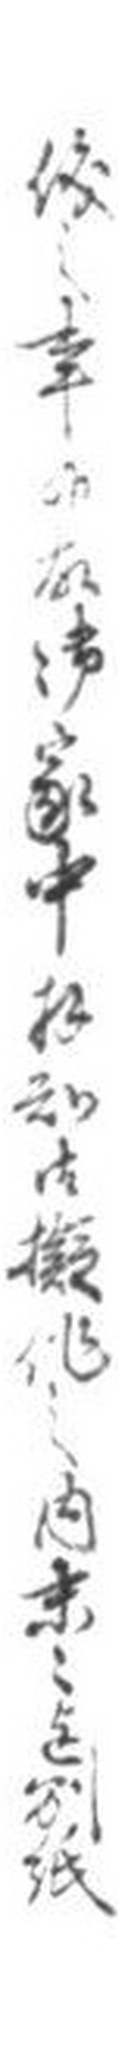儀之事候故御家中拝知御擬作之内末々迄別紙
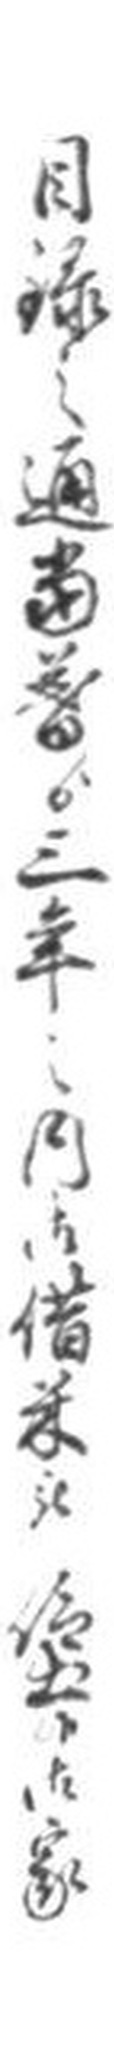目録之通当暮ゟ三年之内御借米被仰出候御家
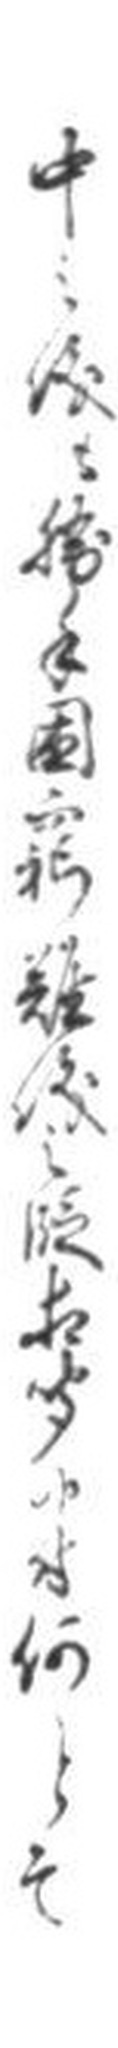中之儀も勝手困窮難儀之段相聞候付何とそ
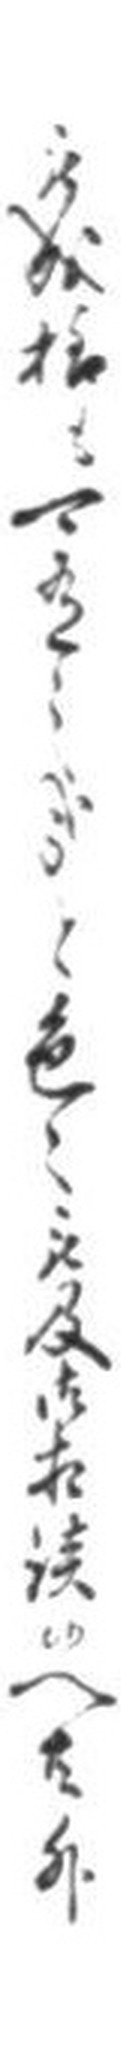被成様も可有之哉と色々被及御相談候へ共外
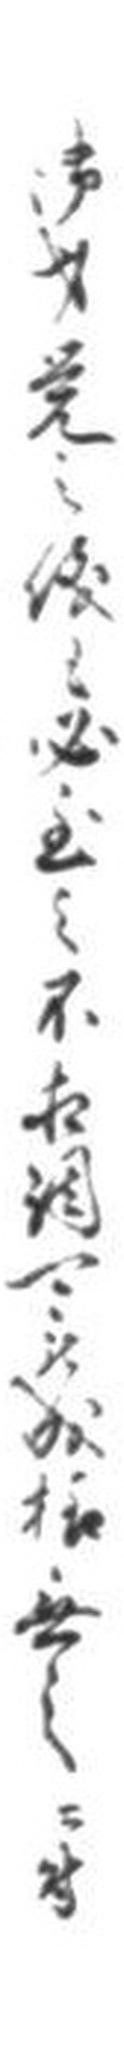御才覚之儀も必至与不相調可被成様無之ニ付
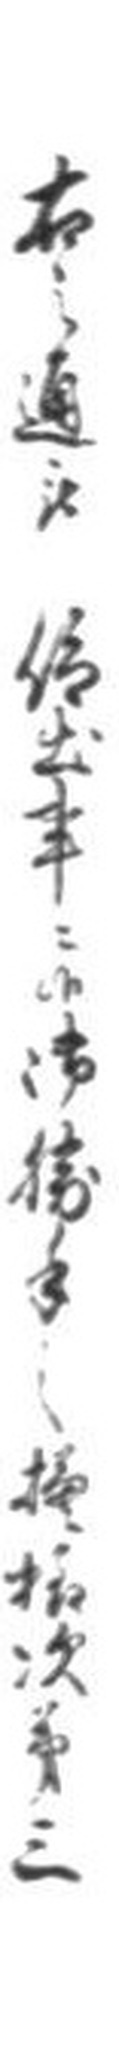右之通被仰出事ニ候御勝手之模様次第三
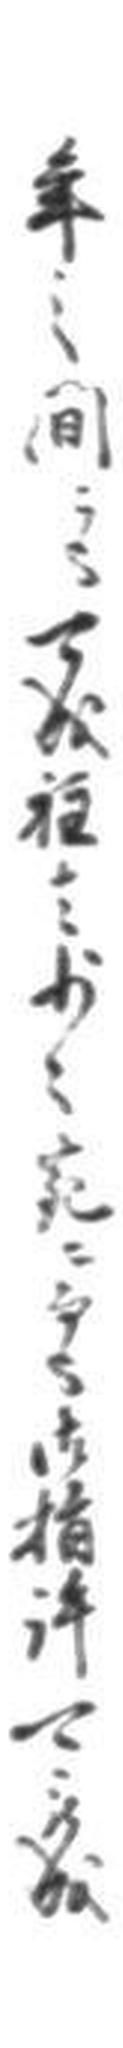年之間ニ而可成程者少々宛ニ而も御指許可被成
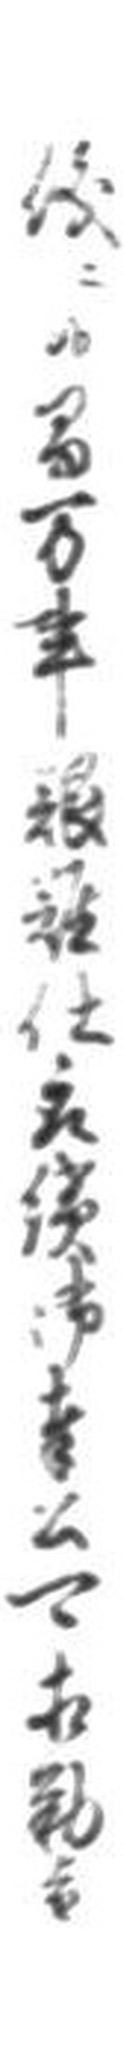儀ニ候間万事艱難仕取続御奉公可相勤旨
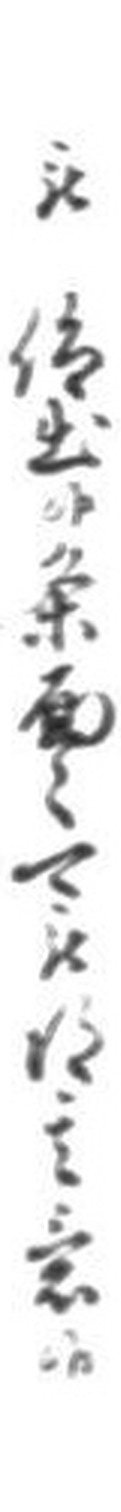被仰出候条面々可被得其意候
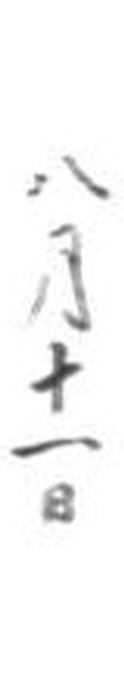八月十一日
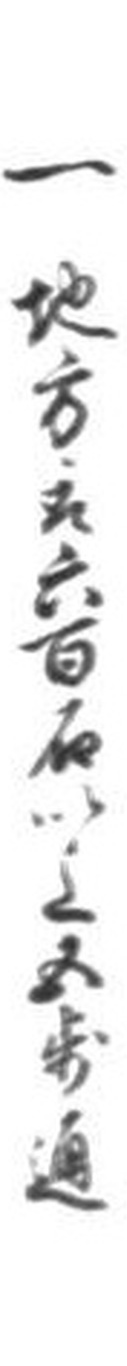一地方取六百石以上五歩通
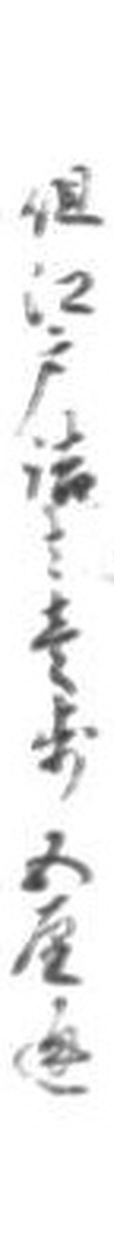但江戸詰者壱歩五厘通
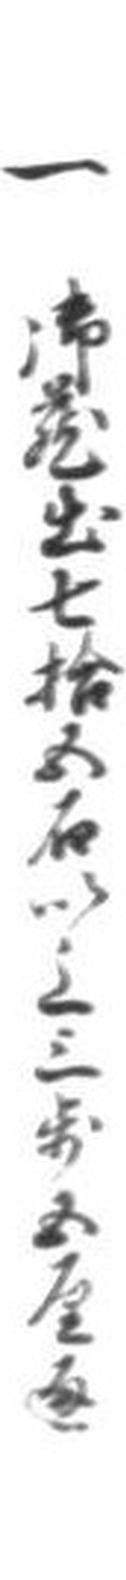一御蔵出七拾五石以上三歩五厘通
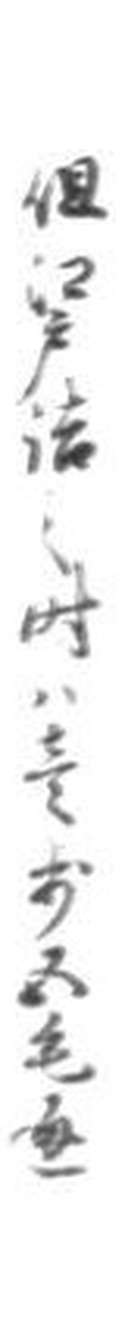但江戸詰之時ハ壱歩五毛通

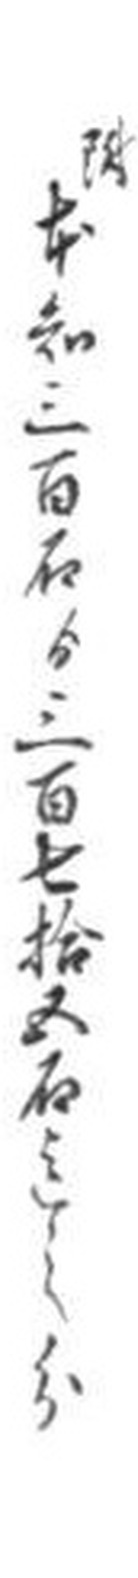本知三百石ゟ三百七拾五石迄之分
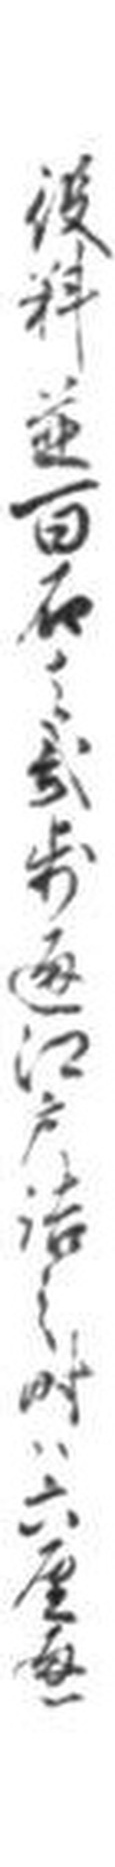役料並百石者弐歩通江戸詰之時ハ六厘通
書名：家譜 三十八 宗矩公 従享保九年五月到享保九年十二月
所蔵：福井県文書館 Fukui Prefectural Archives
